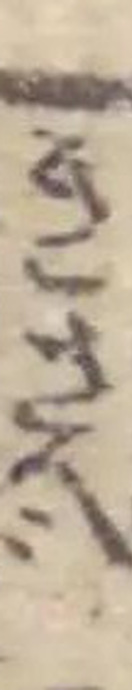きさへ
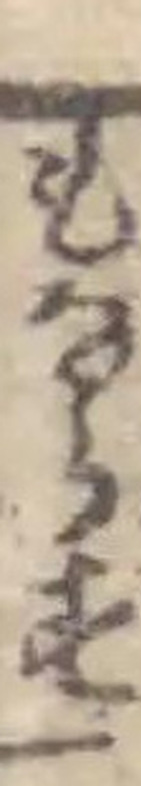もならず
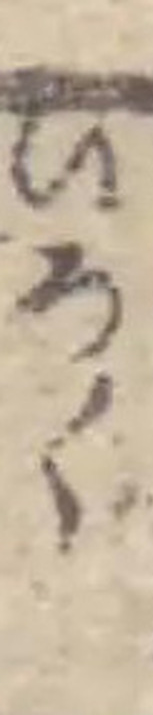いろ〳〵
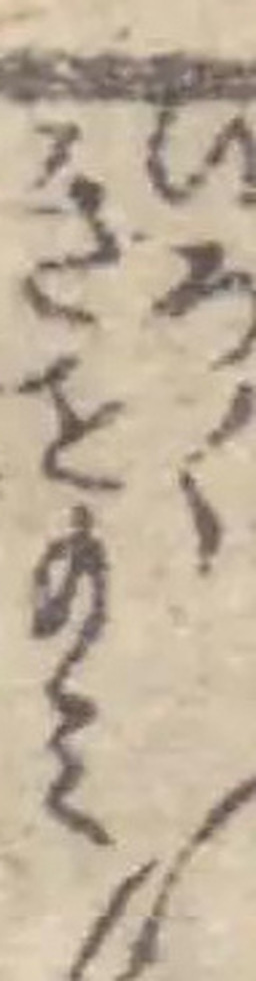きをもみ
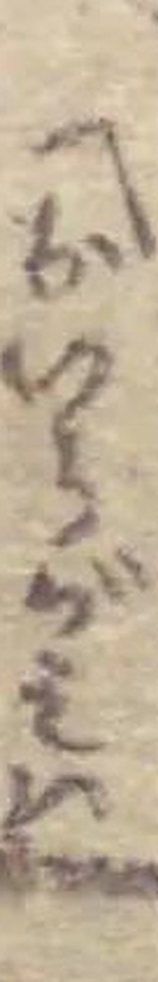〽おいらがみは
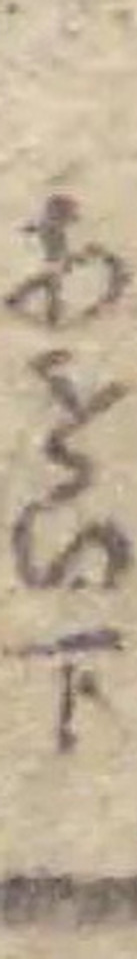あをい下
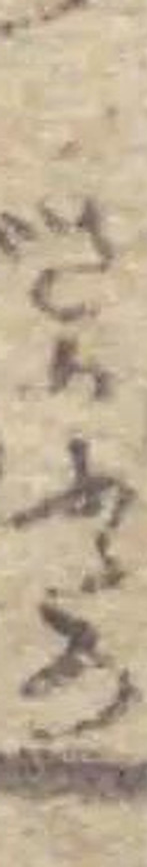さかふたつ
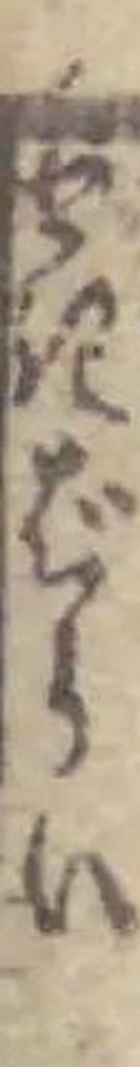せきばらい
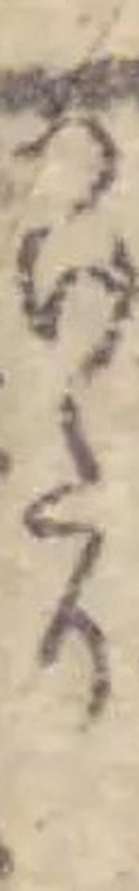かけたり
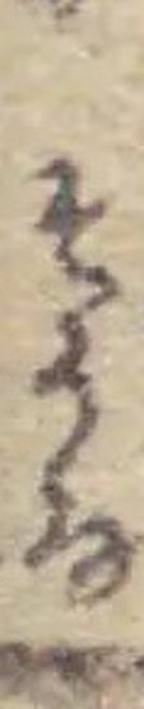そうな
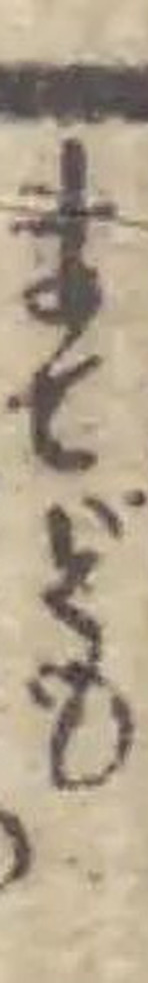まてども
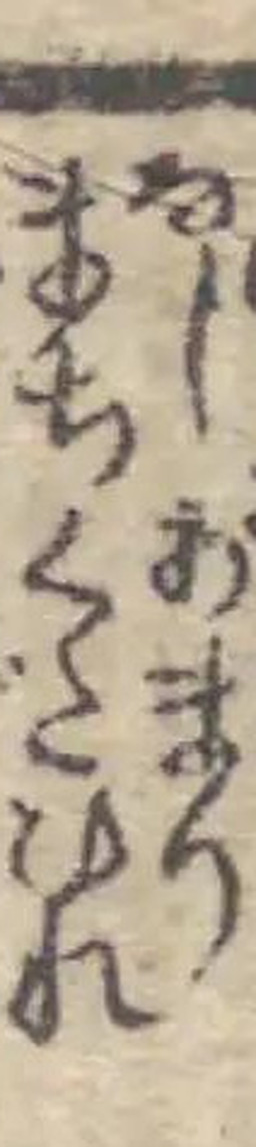まちくたひれ
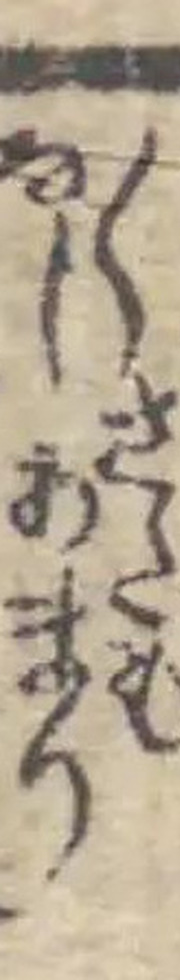なしあまり
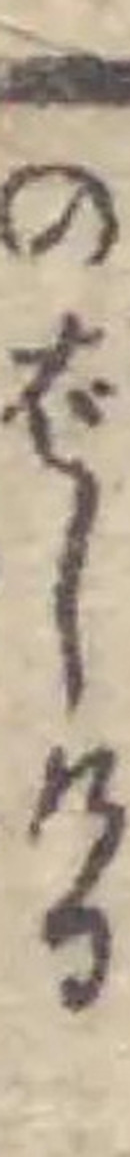のばしける
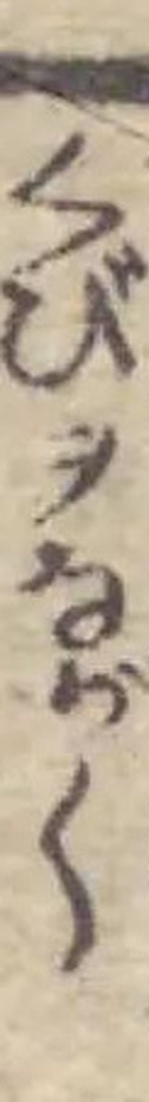くびながし
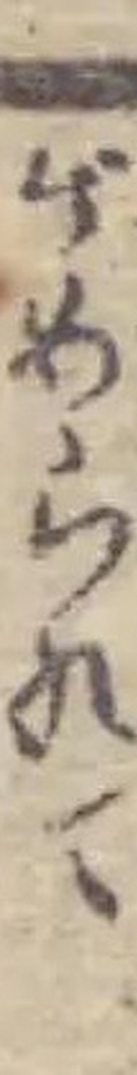がめられて
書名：化物尽 4巻
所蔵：国立国会図書館 National Diet Library, JAPAN
